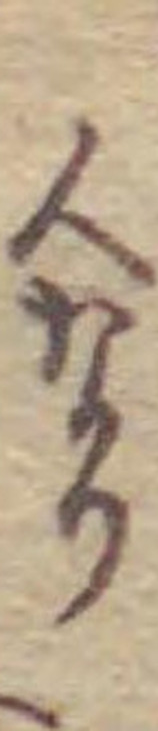人なり
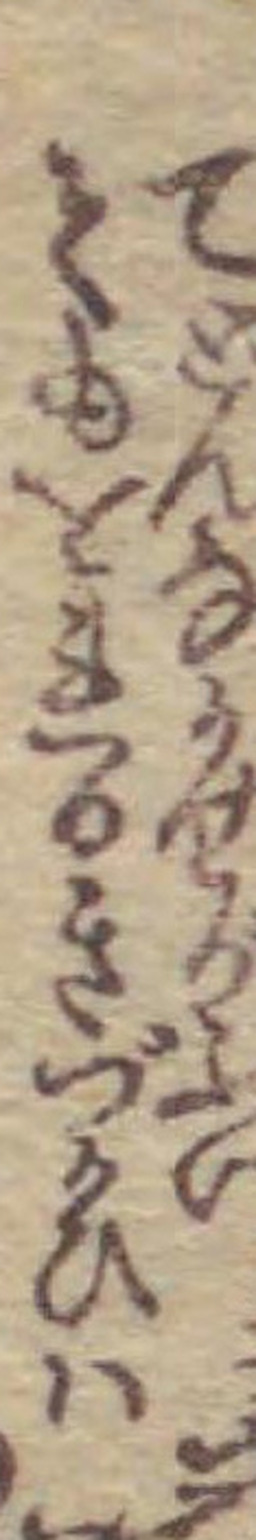てもをれるきづかひは
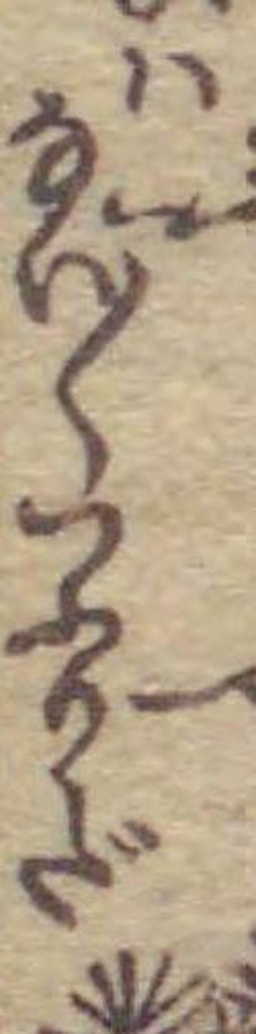ない〳〵つふりだ

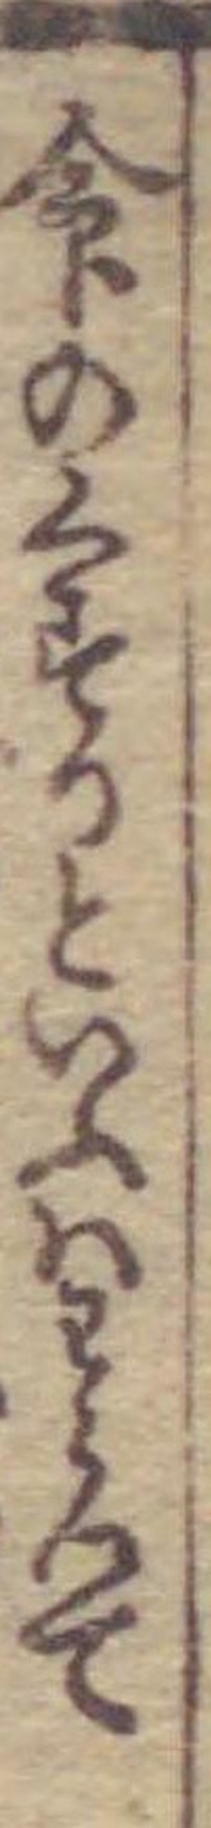命のくすりといふはわらつて
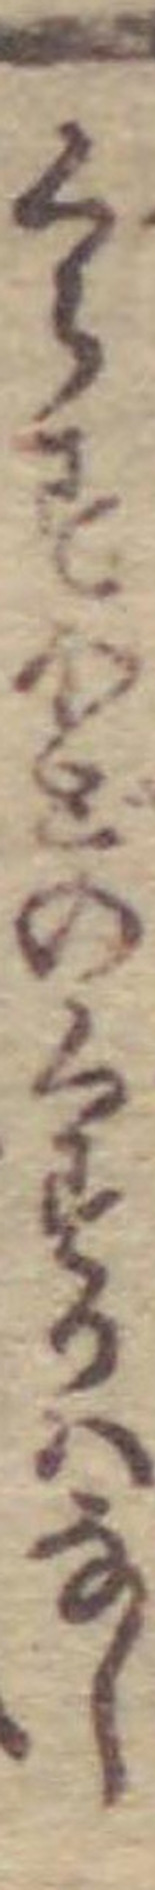くらすほどのくすりはなし
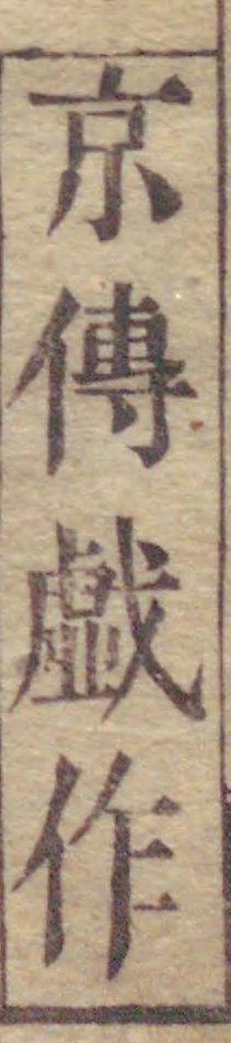京伝戯作
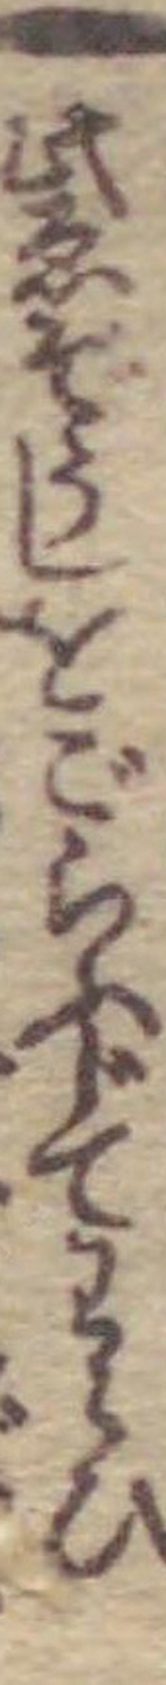此ゑぞうしをごらふじてわらひ
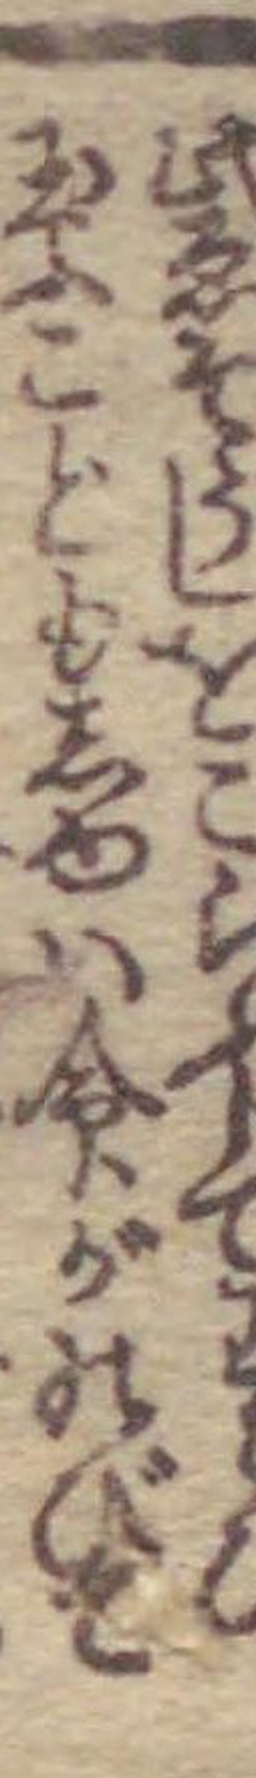玉ふこどもしゆは命がのびて
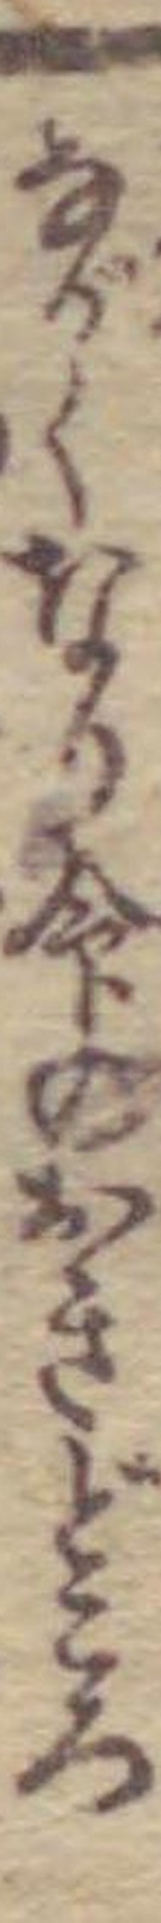ながくなり命のおきどころ
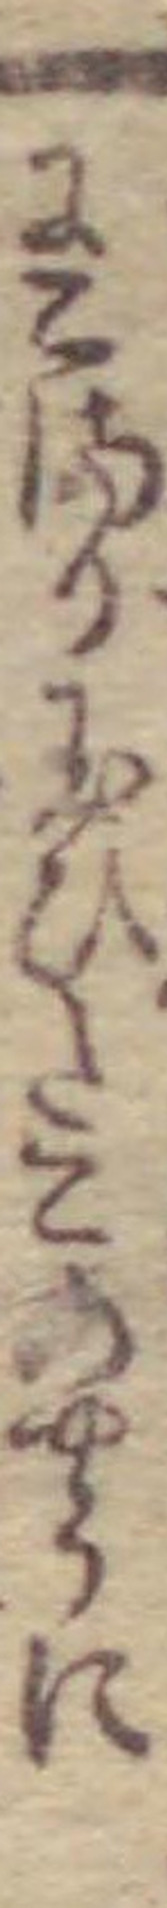にこまり玉ひたこのやうに
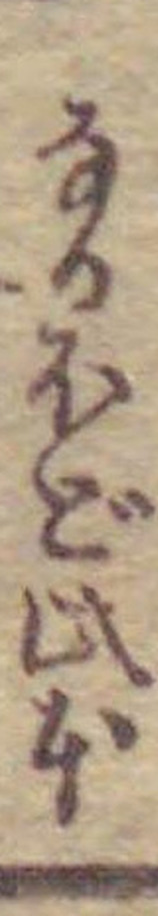なかほど此本
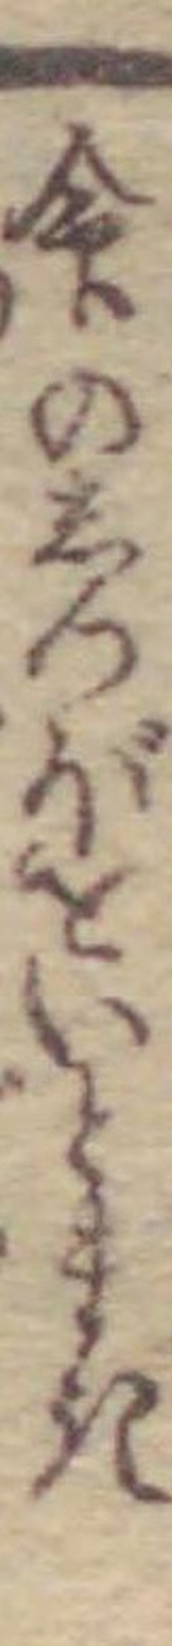命のしつぼをいとまき
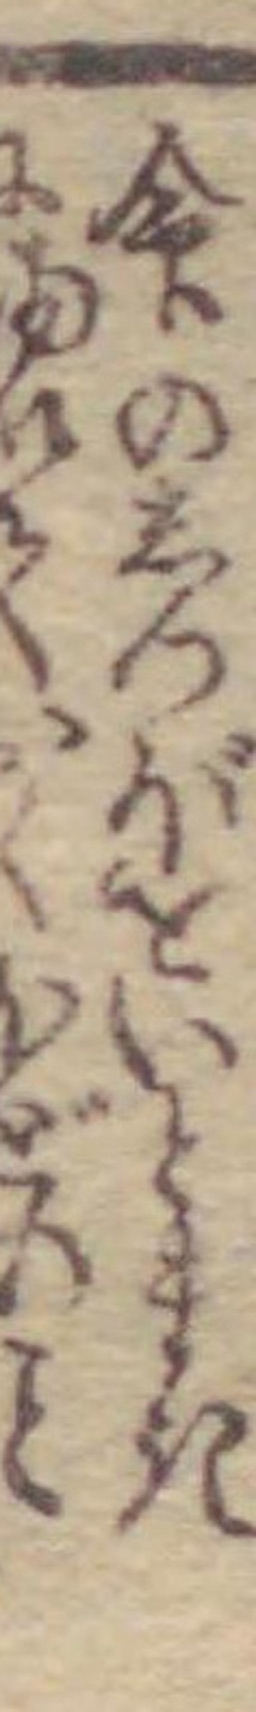にまいておくほどのこと
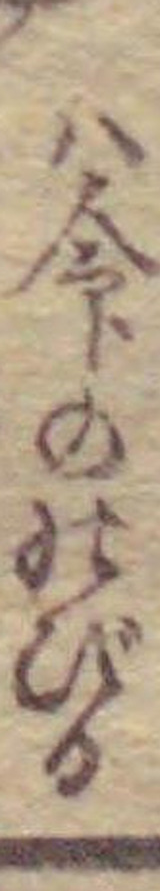は命ののびる
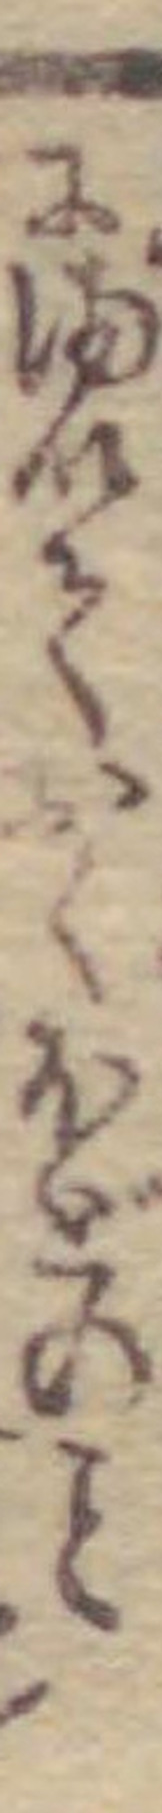にまいておくほどのこと
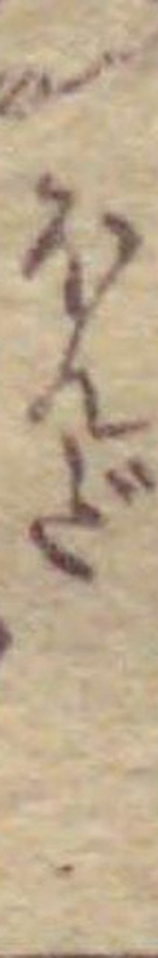ほんだ
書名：御誂染長寿小紋 : 3巻
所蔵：国立国会図書館 National Diet Library, JAPAN
